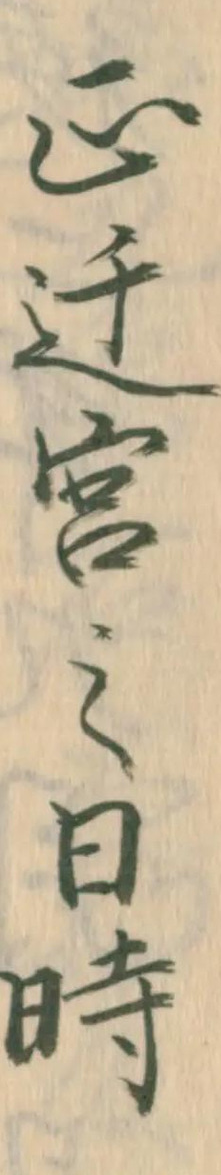正迁宮之日時
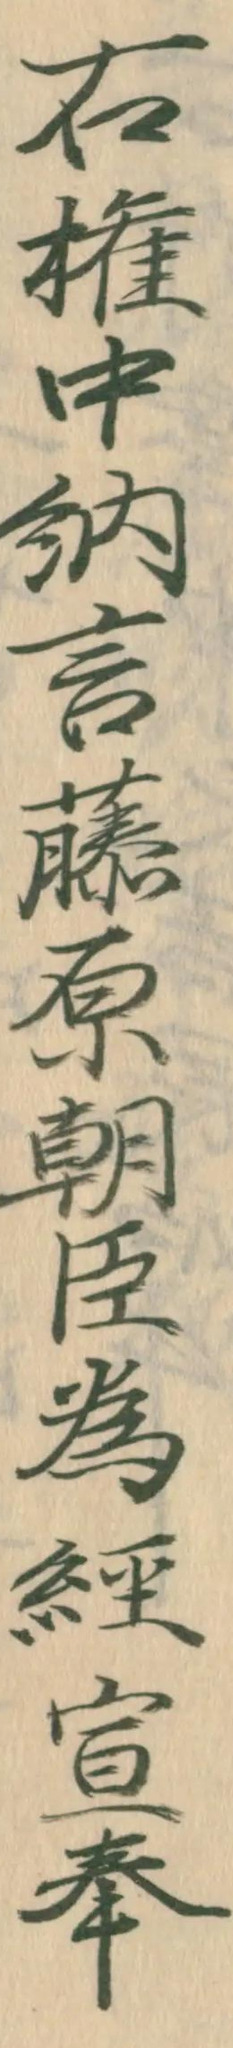右権中納言藤原朝臣為経宣奉
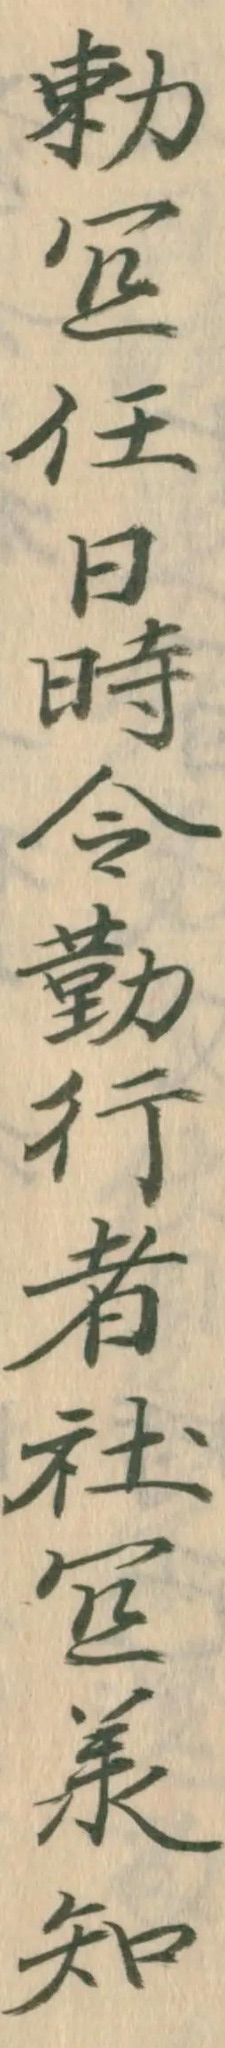勅宜任日時令勤行者社宜承知
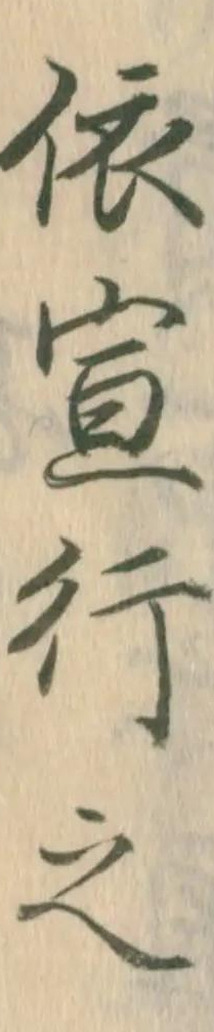依宣行之
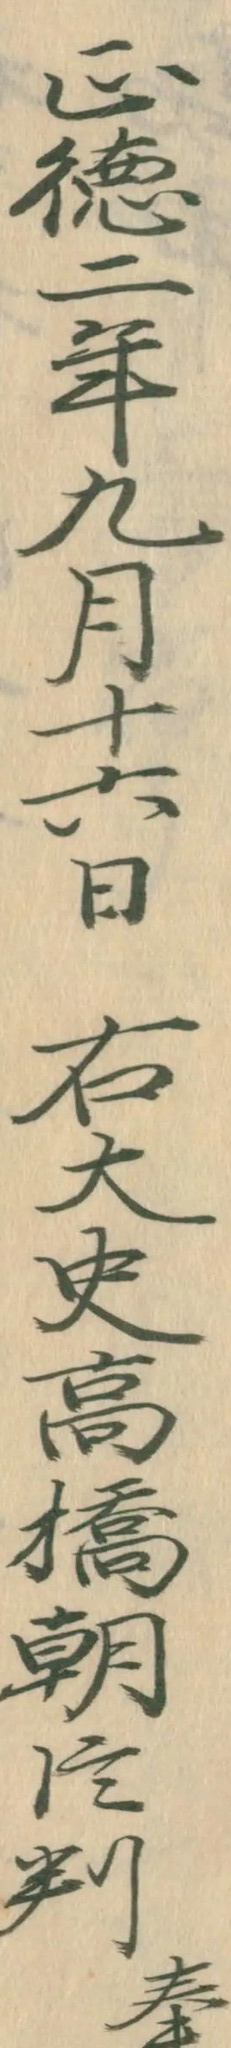正徳二年九月十六日右大史高橋朝臣判奉
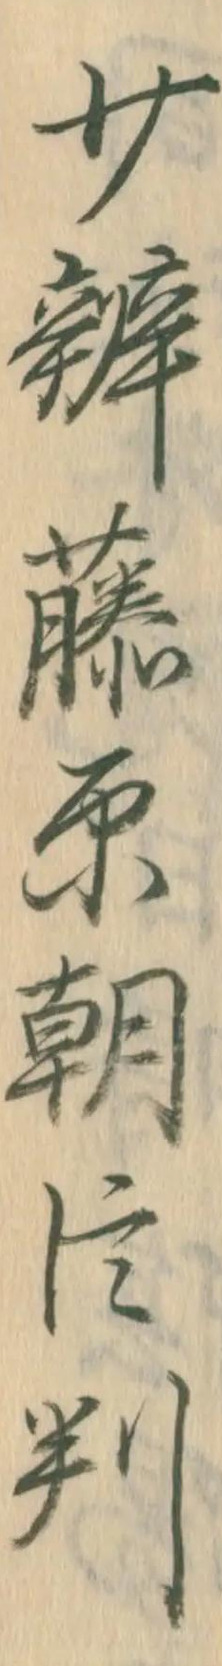少弁藤原朝臣判

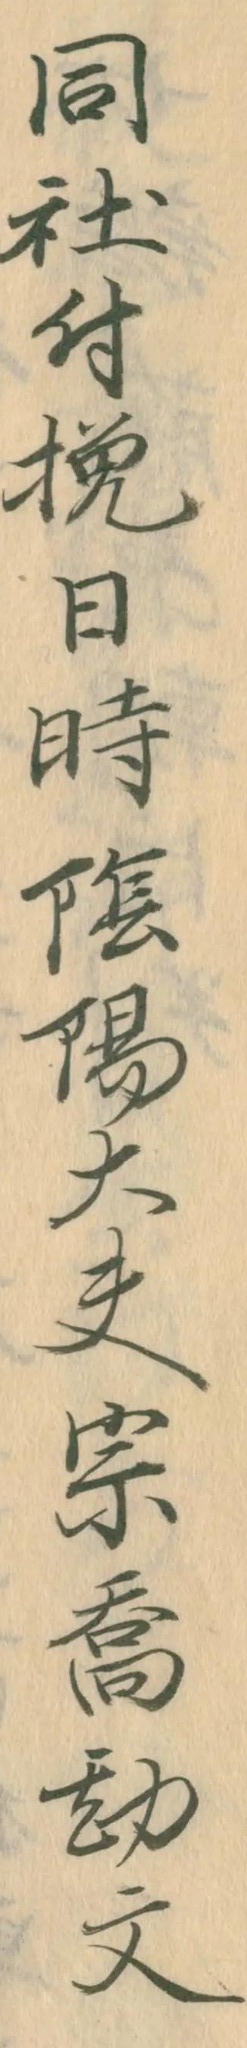同社付挽日時陰陽大夫宗喬勘文
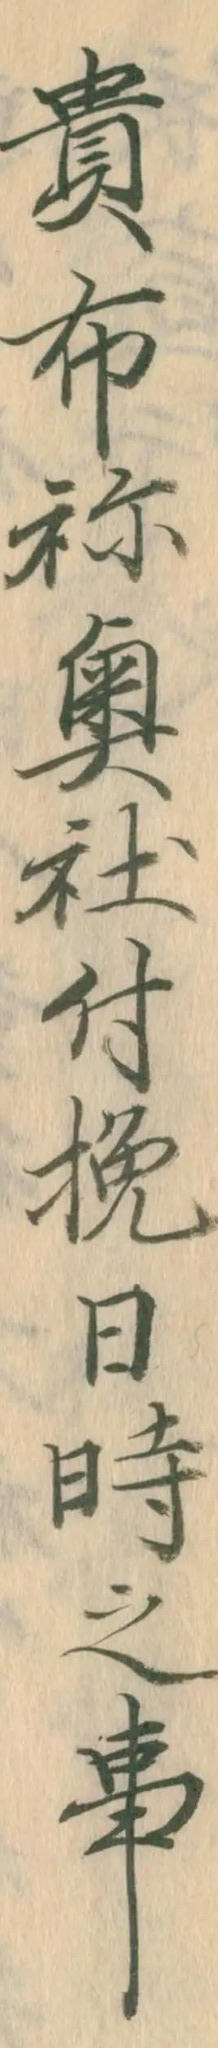貴布祢奥社付挽日時之事
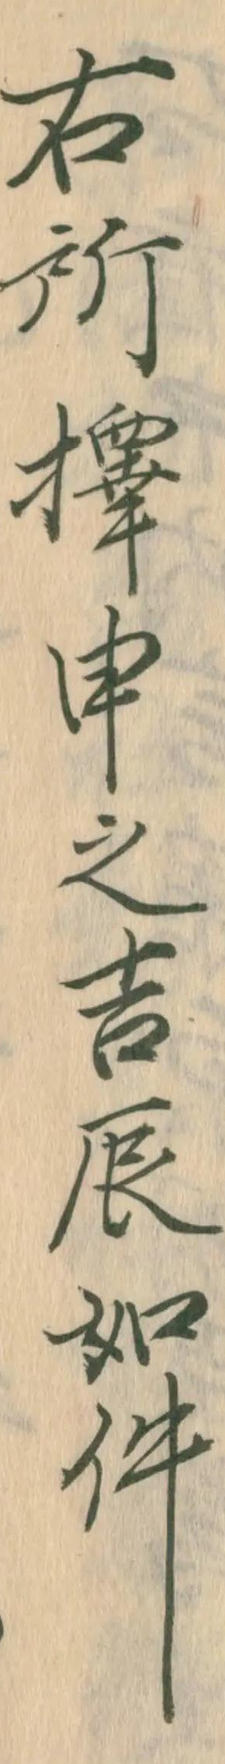右所択申之吉辰如件
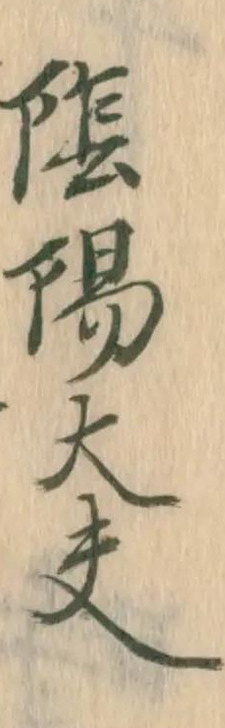陰陽大夫
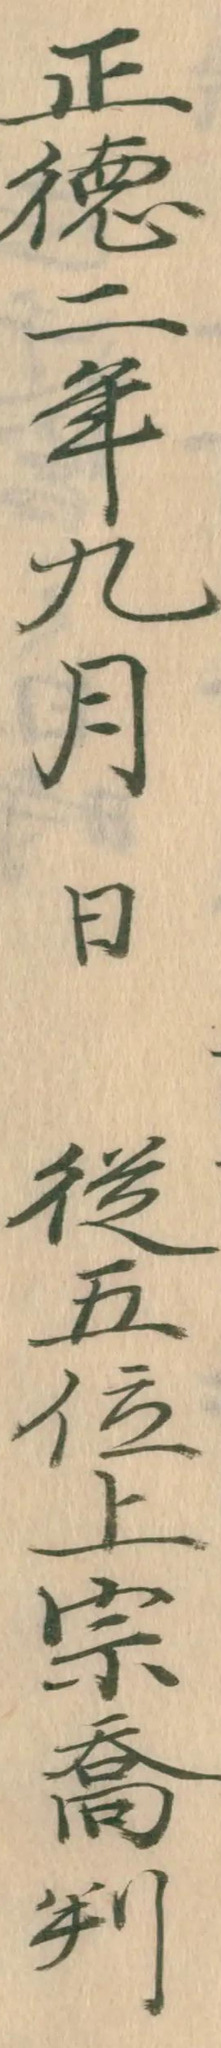正徳二年九月日従五位上宗喬判
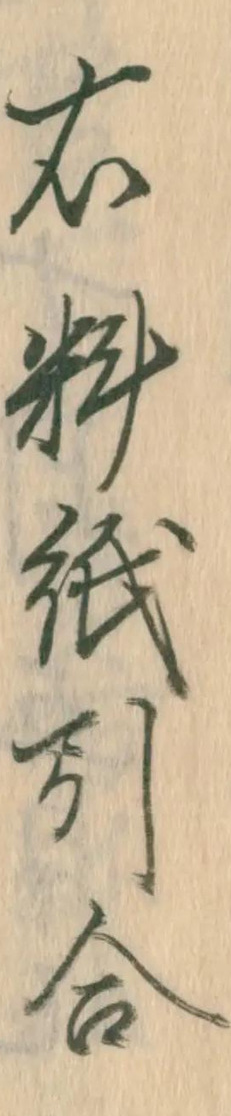右料紙引合
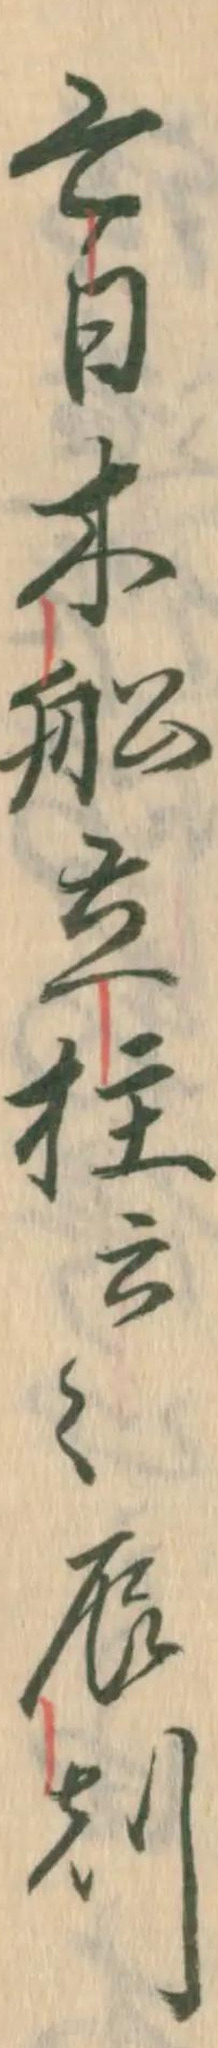今-日木_船立-柱云々辰_刻
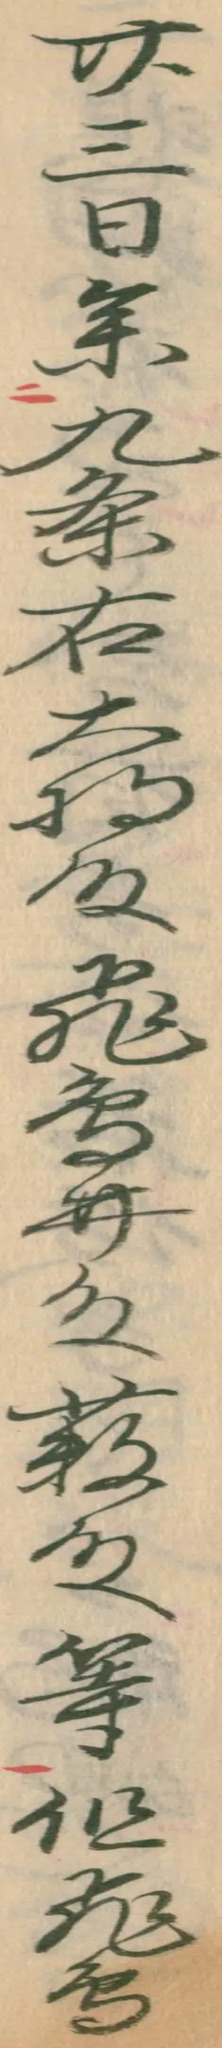廿三日参九条右大将殿飛鳥井殿薮殿等但飛鳥
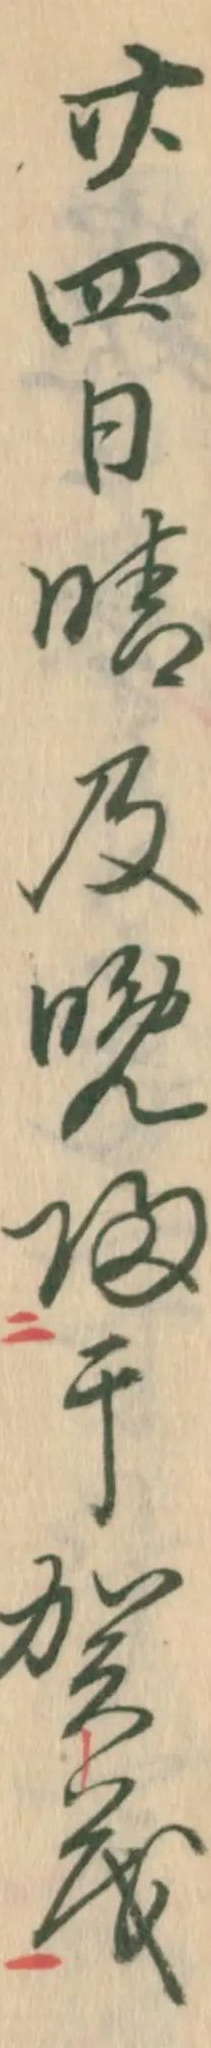廿四日晴及晩帰于賀-茂
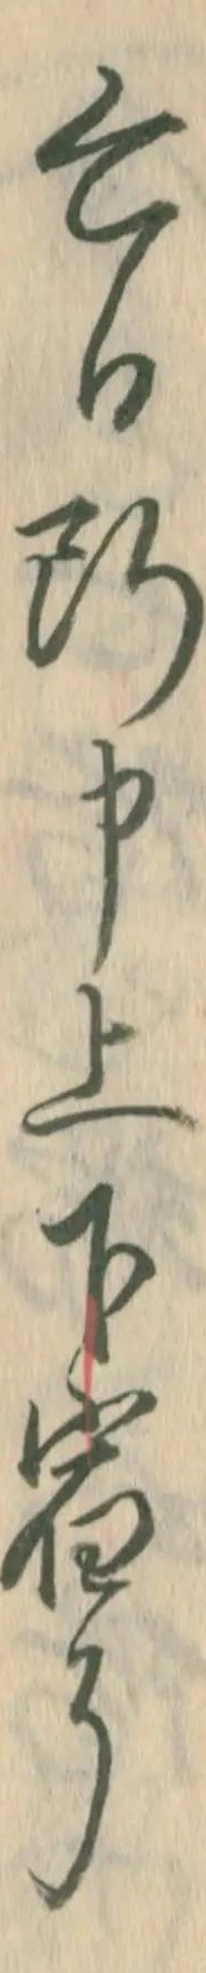今日断申上下-宿了
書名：賀茂社記録. 第16冊
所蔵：国立国会図書館 National Diet Library, JAPAN
